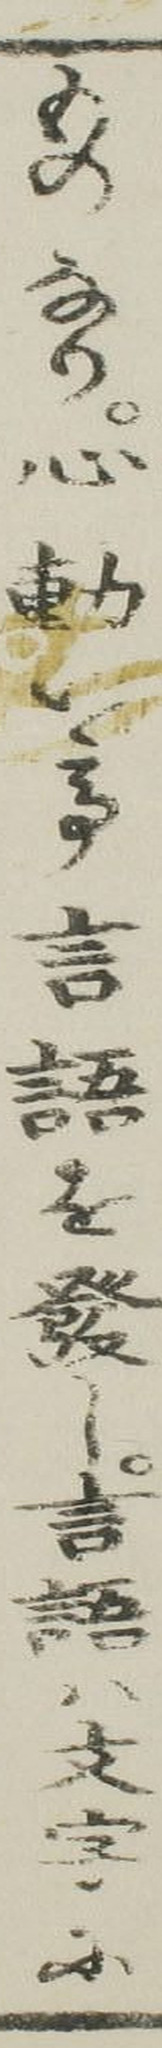ものなり。心動いて言語を発し。言語は文字に
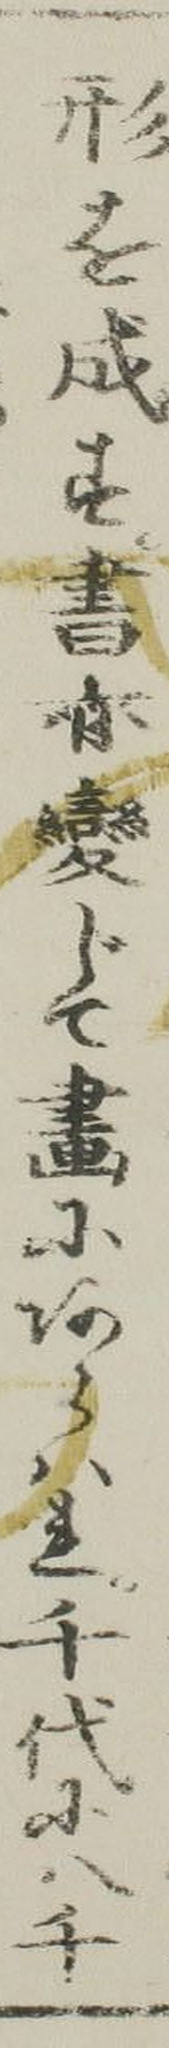形を成す。書亦変じて画にあらはれ。千代に八千
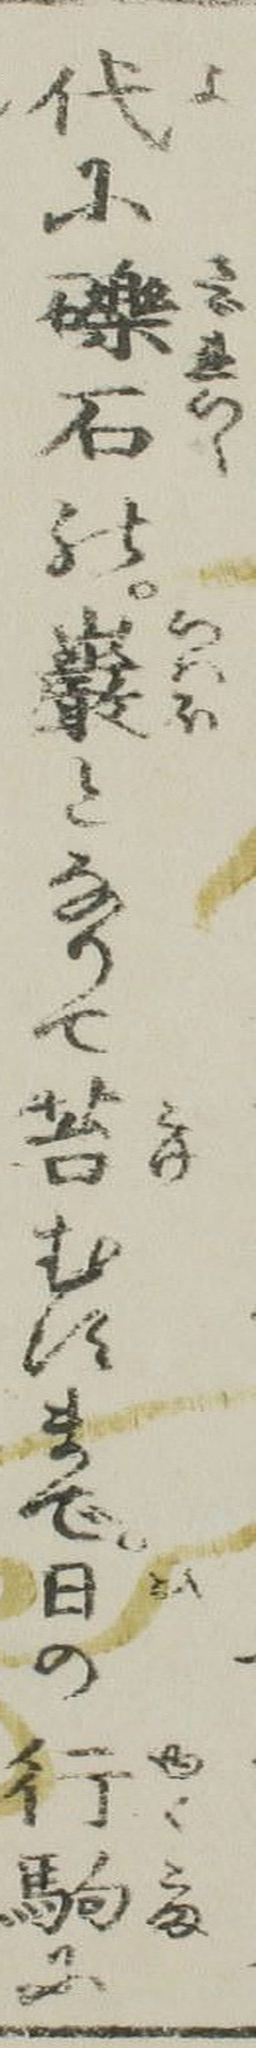代に礫石の。巌となりて苔むすまで。日の行駒に
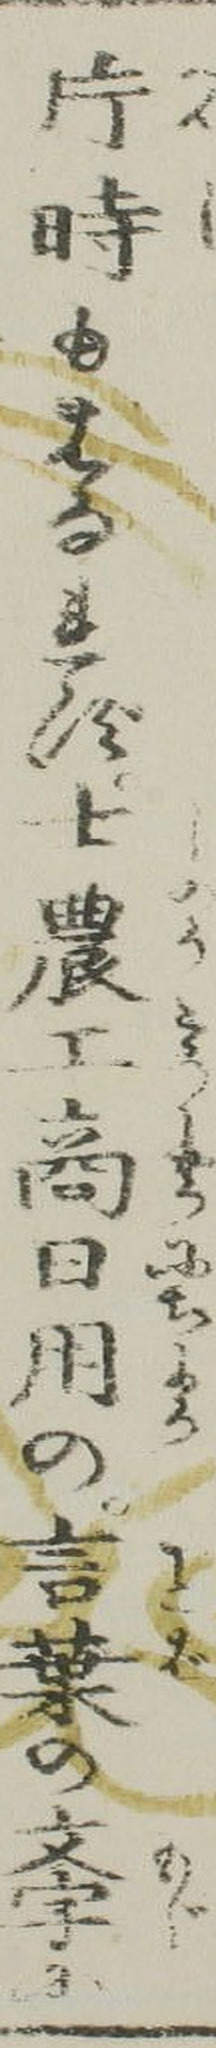片時もはなれず。士農工商日用の。言葉の文字に
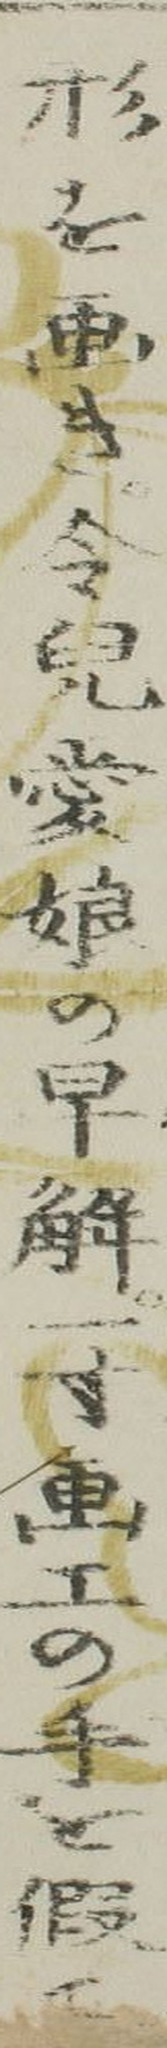形を画き。令児愛娘の早解。一寸画工の手を仮て
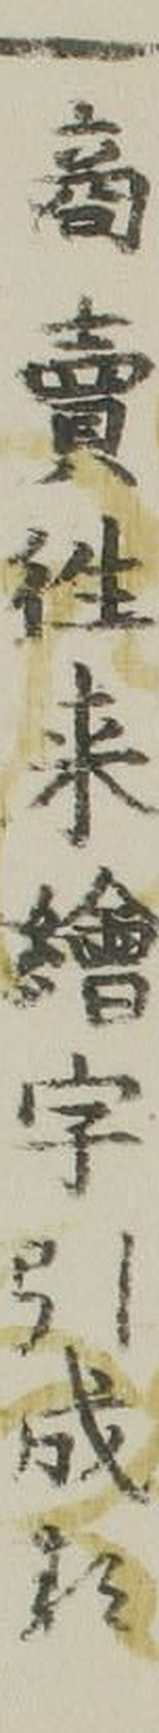商売往来絵字引成る
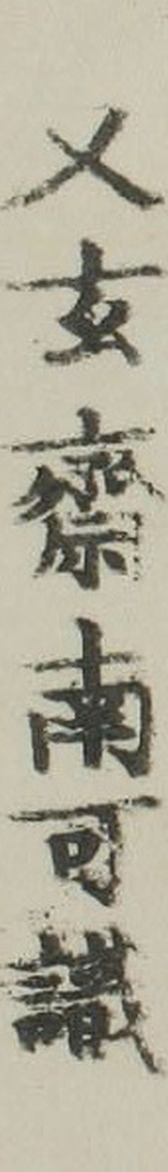又玄斎南可識

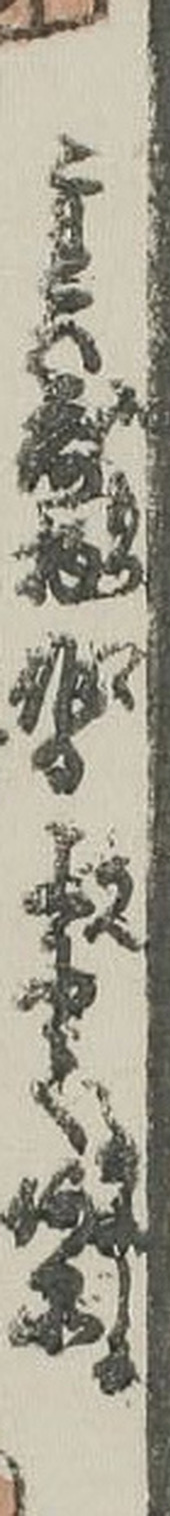これは荷物作る上にて何品
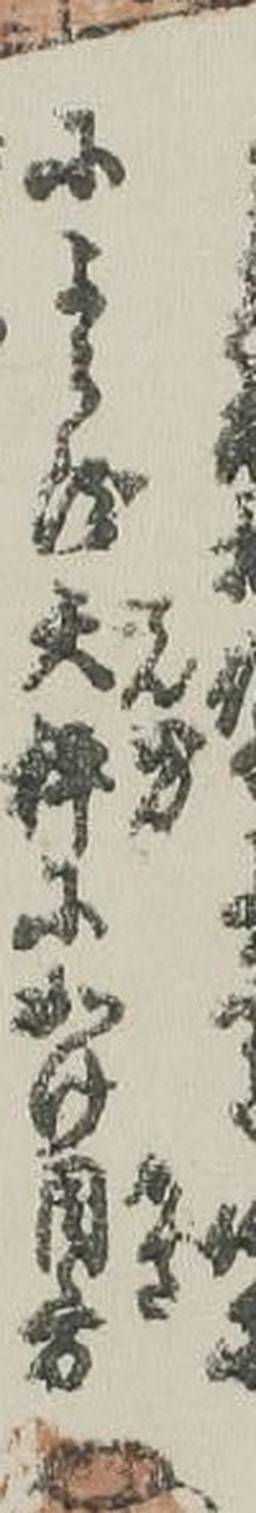によらず天秤にかけ目方
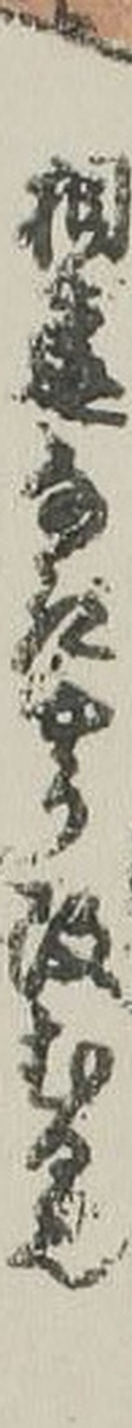相違なきやう改むる也
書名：商売往来絵字引
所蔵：東京学芸大学教育コンテンツアーカイブ
